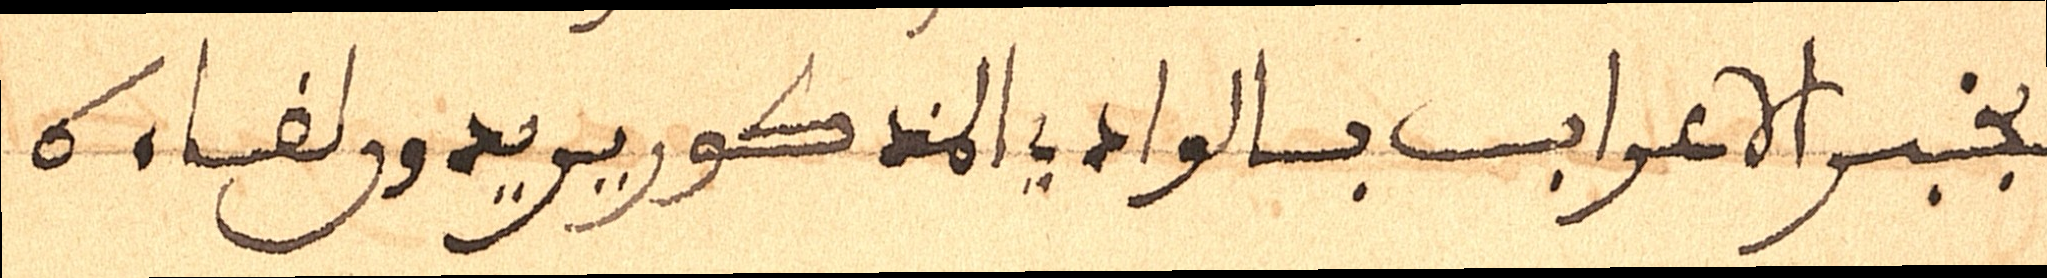بخبر الاعراب بالوادي المذكور يريدون لقاءه
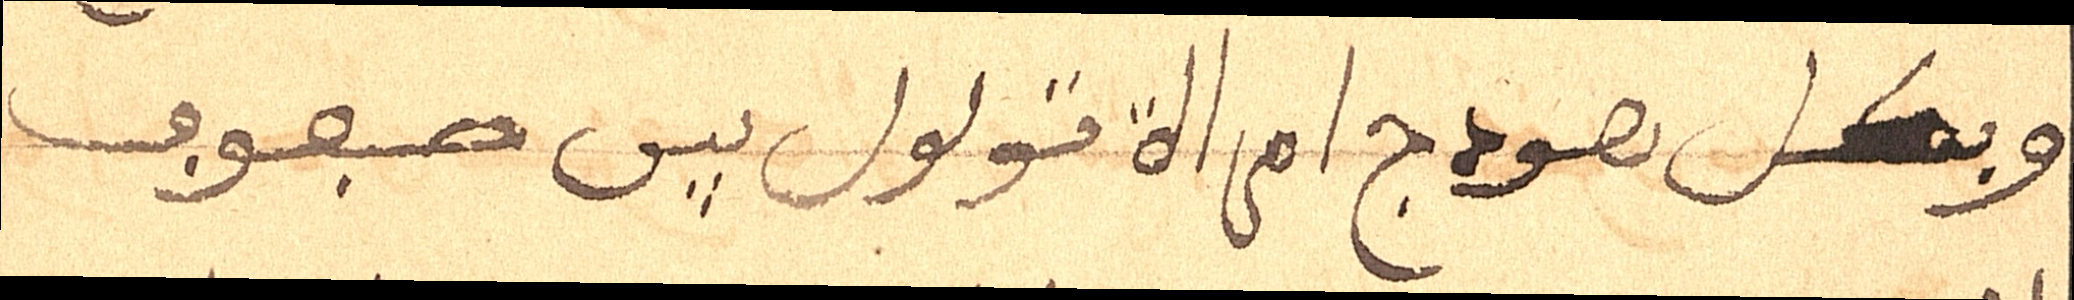وبطل هودج امراة تولول بين صفوف
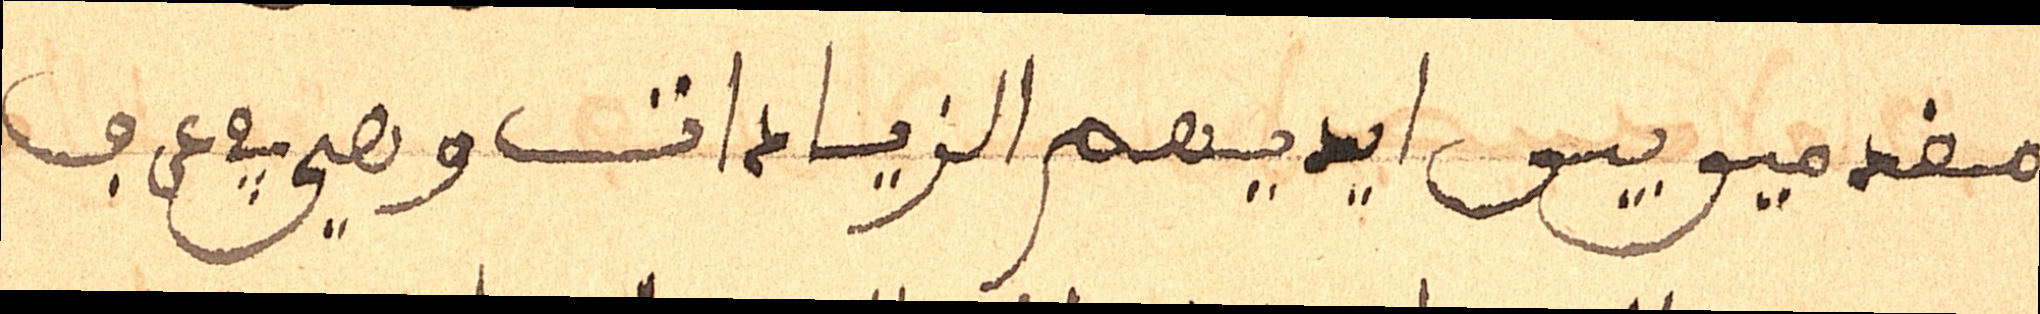مقدمين بين ايديهم الزيادات وهي في عرف
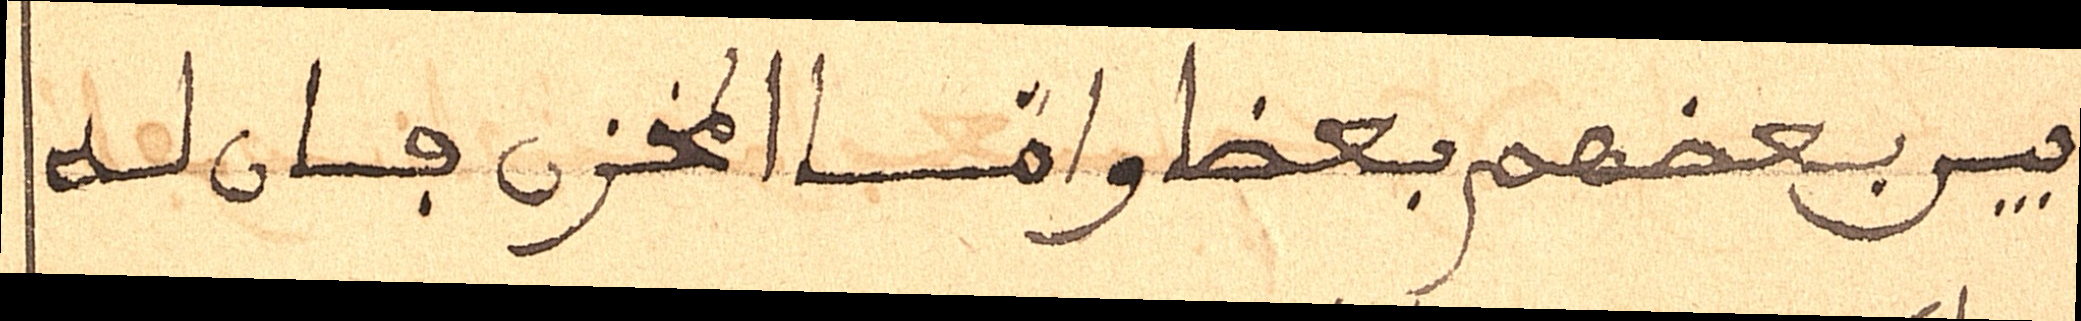بين بعضهم بعضا واما المخزن فان له
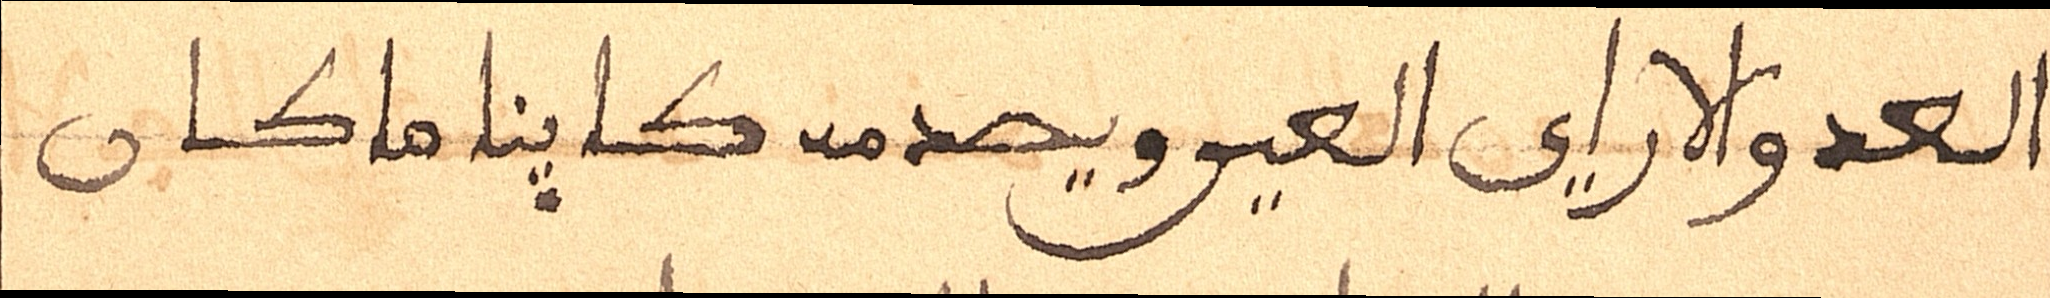العدو الا راي العين ويصدمه كائنا ما كان
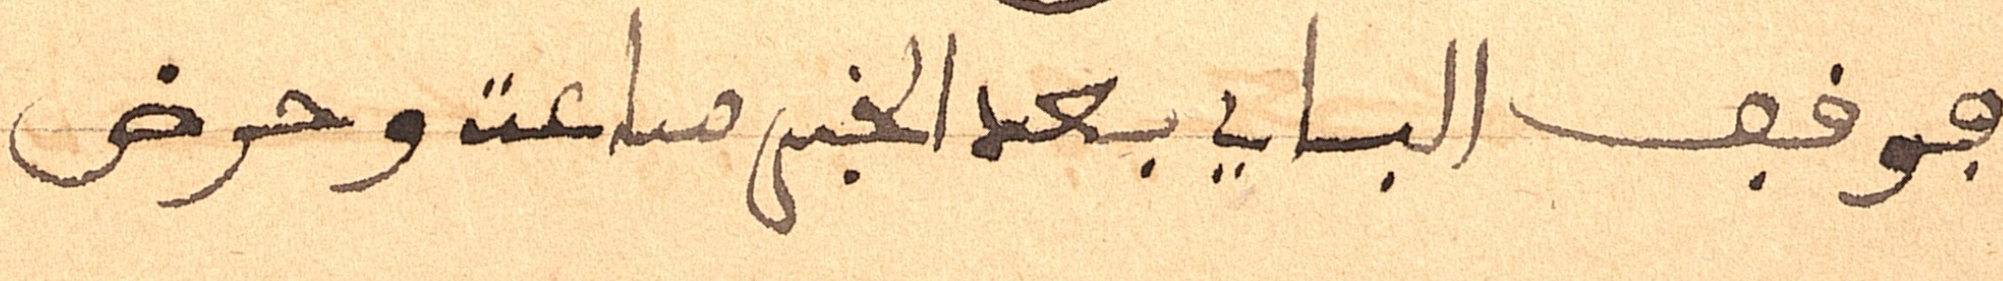فوقف الباي بعد الخبر ساعت وحرض
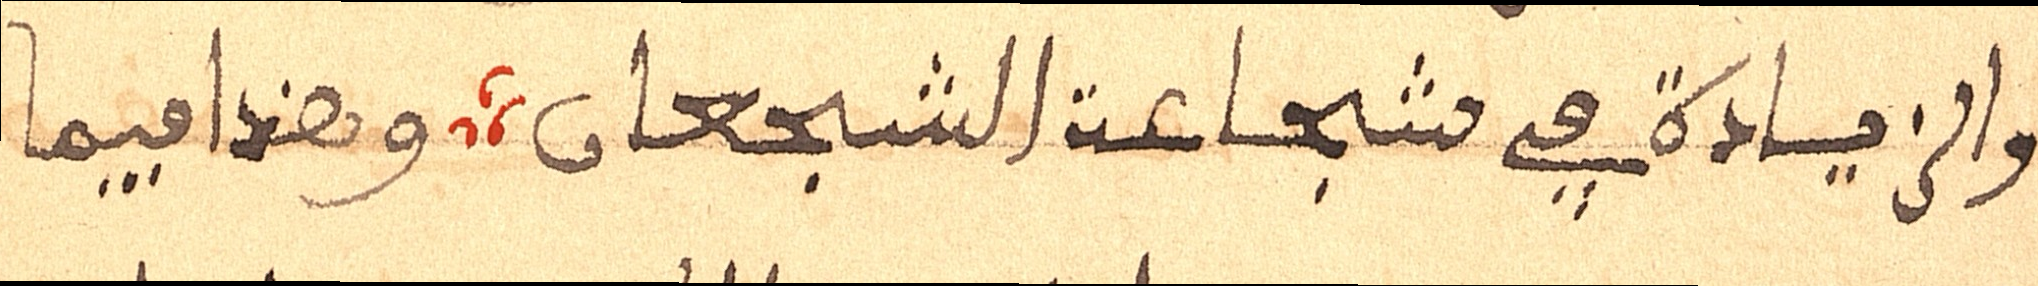والزيادة في شجاعة الشجعان وهذا فيما
